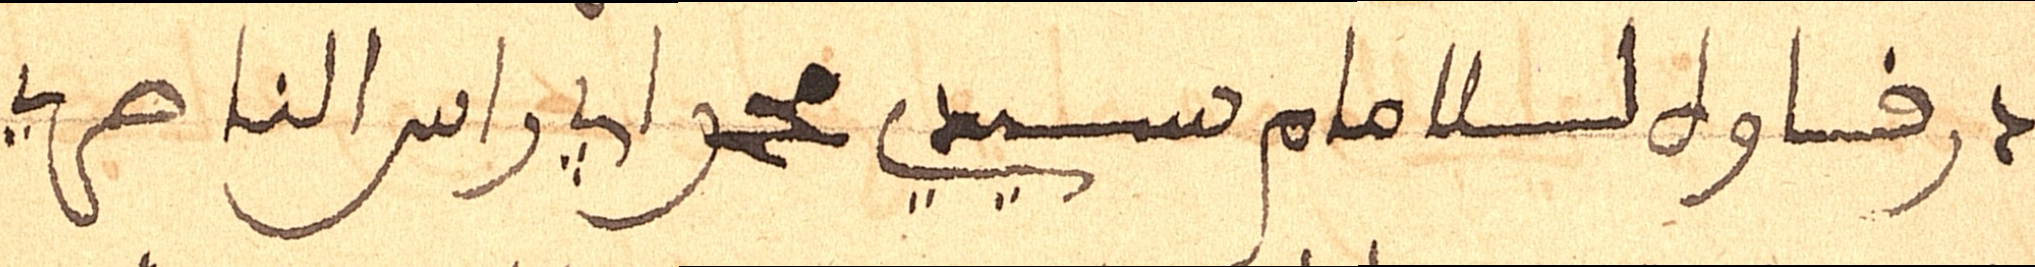درقاوه للامام سيدي محمد ابي راس الناصري
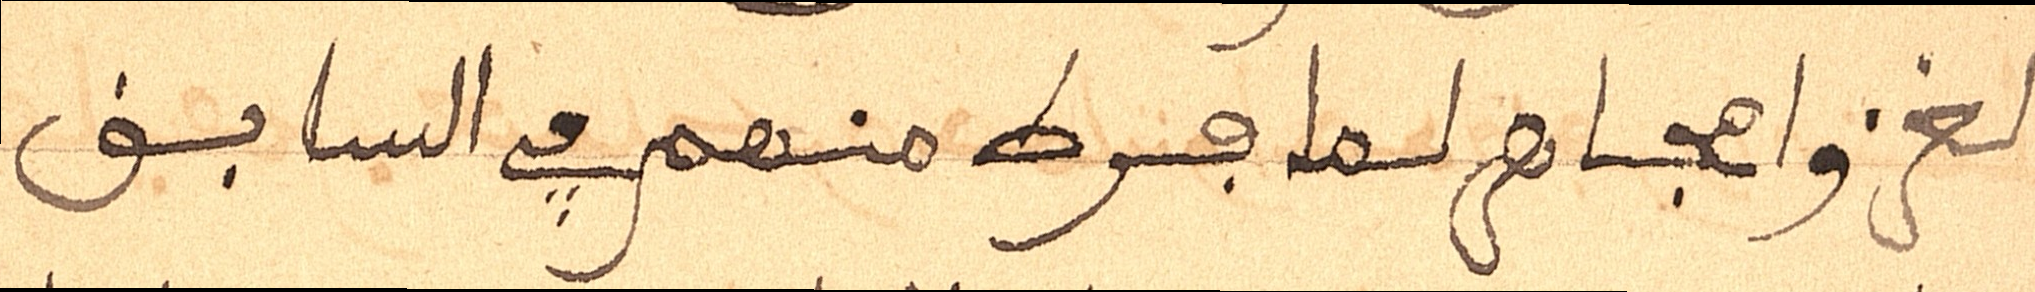لغزوامجاهر لما فرط منهم في السابق
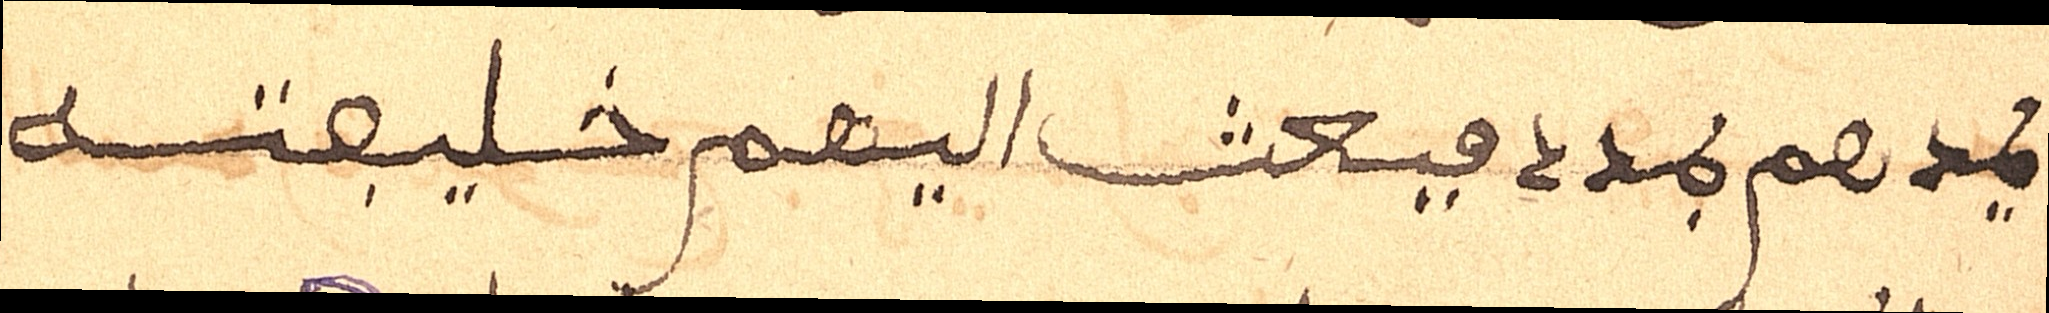يمدهم بمدد فبعث اليهم خليفته
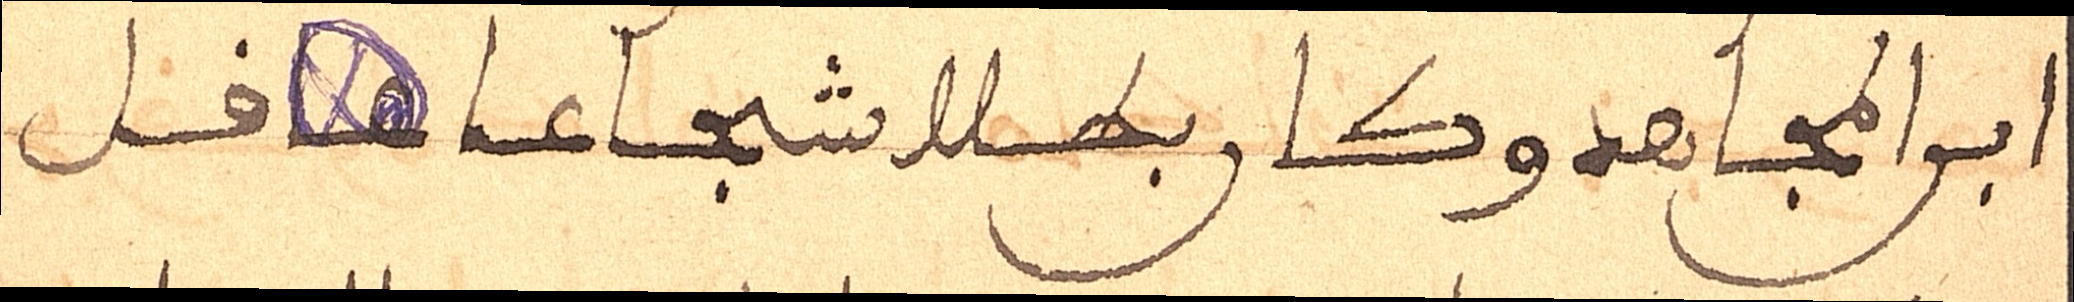ابن المجاهد وكان بطلا شخاعا # قل
